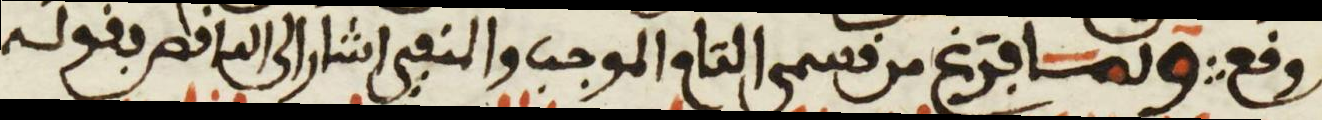وقع و لما فرغ من سمى التام الموجب و المنفي اشار الى الناقص بقوله
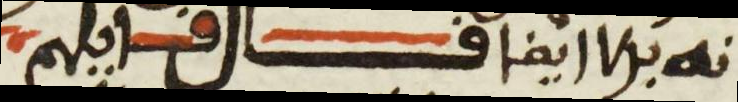نه بدلا ايضا قال قايلهم
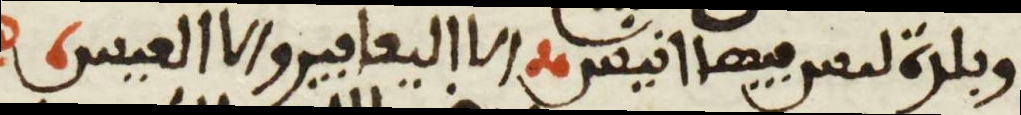و بلدة لمس فيها انيس الا اليعافير و الا العيس
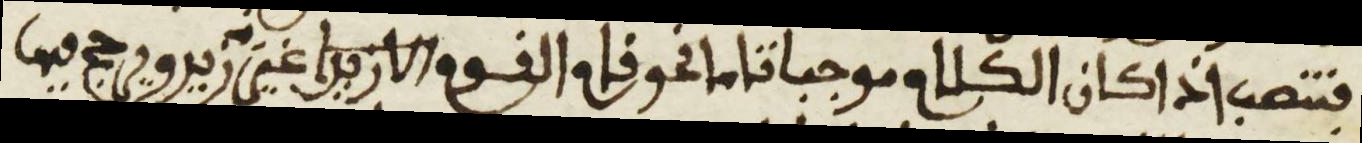فتنصب اذا كان الكلام موجبا تاما نحو قام القوم الا زيدا غير زيد و يرجح فيها
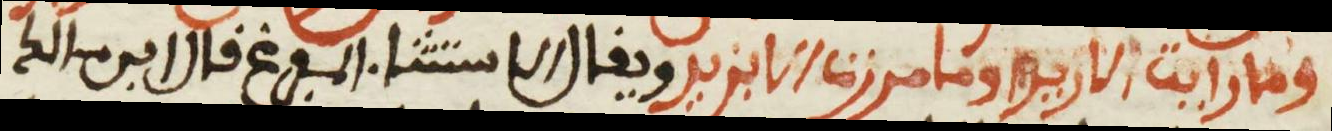و ما رايت الا زيدا و ما مررت الا بزيد و يقال الاستثناء المفرغ قال ابن مالك
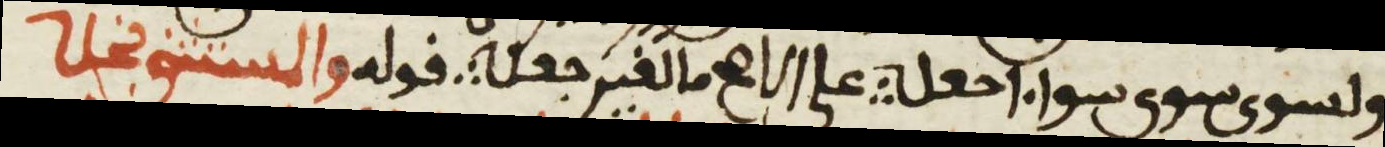و لسوى سوى سواء اجعل على الاصح ما لغير جعلا قوله و المستثنى بخلا
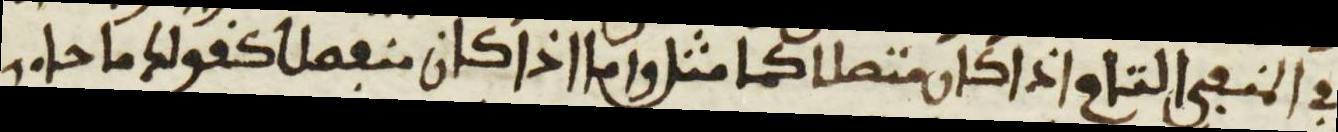فى المنفى التام اذا كان متصلا كما مثل و اما اذا كان منفصلا كقولها ما جاء
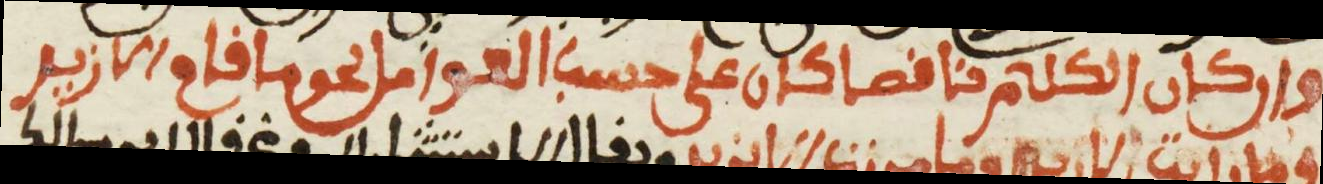و ان كان الكلام ناقصا كان على حسب العوامل نحو ما قام الا زيد
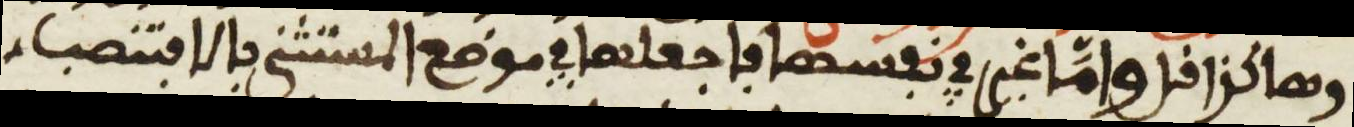و هاكذا قل و اما غير في نفسها فاجعلها في موضع المستثنى بالا فتنصب
